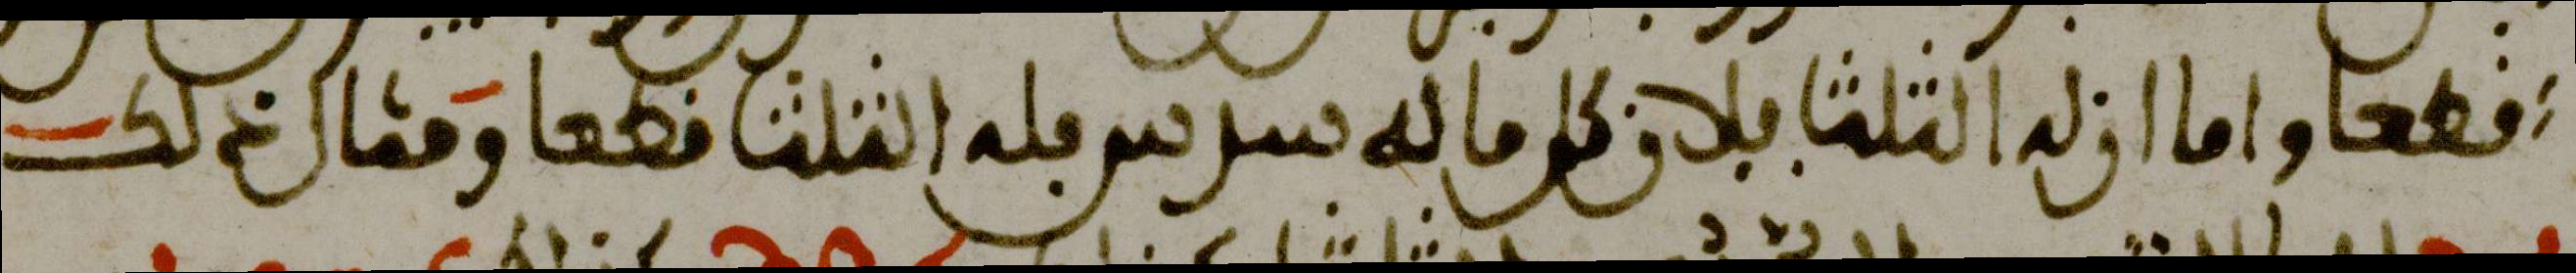قطعا واما ان له الثلث فلان كل ماله سدس فله الثلث قطعا وَمثال ذلكَ
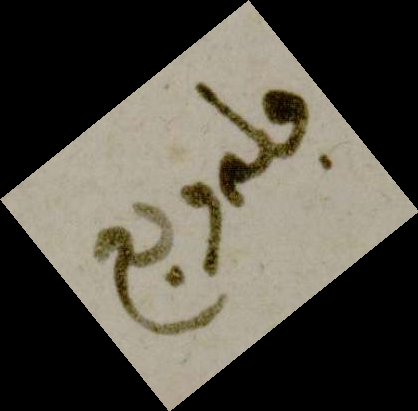فله ربع
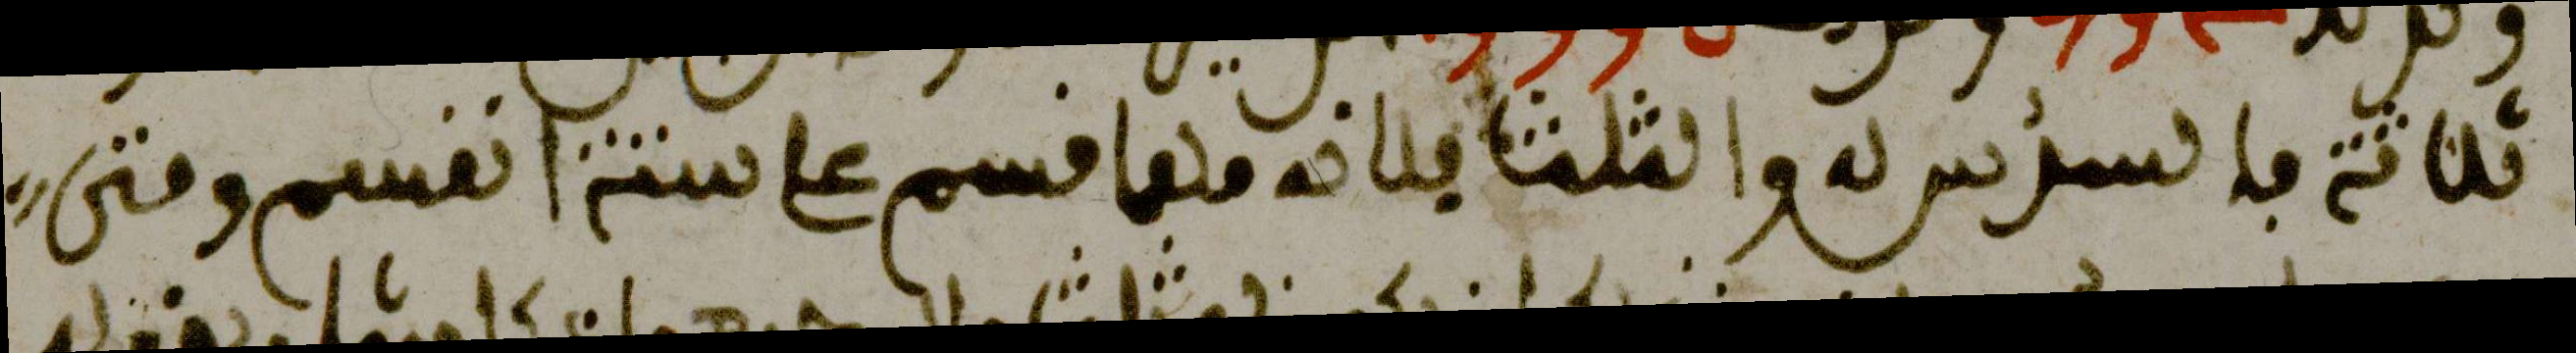ثلاثة فالسدس له والثلث فلانه مهما قسم على ستة انقسم ومتى
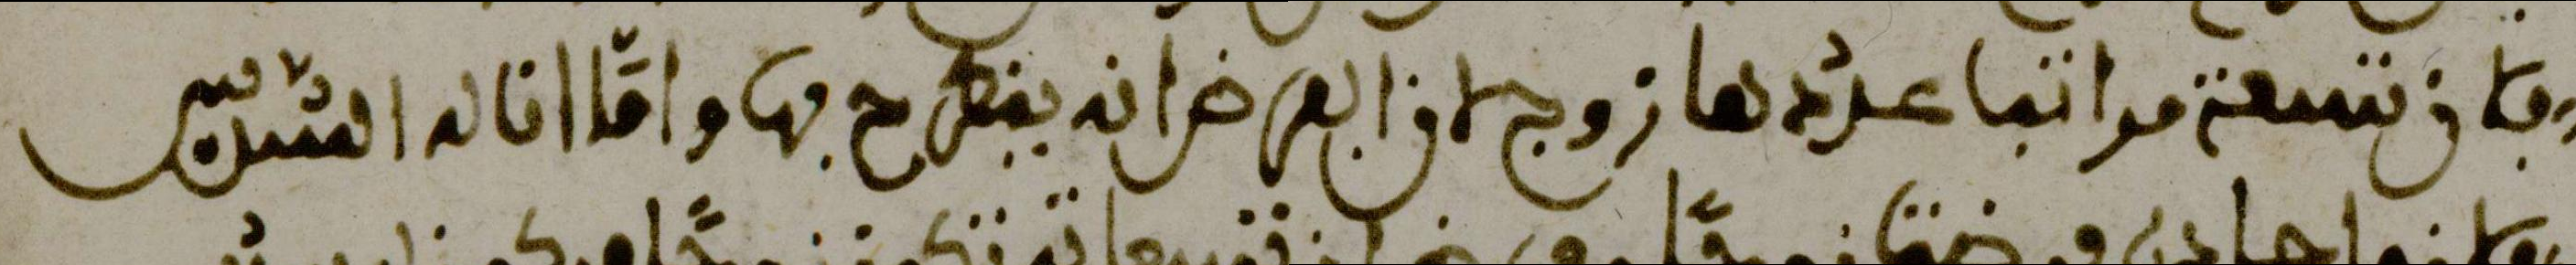فلان تسعة مراتب عددها زوج لان الفرض انه ينطرح بها وامّا ان له السّدس
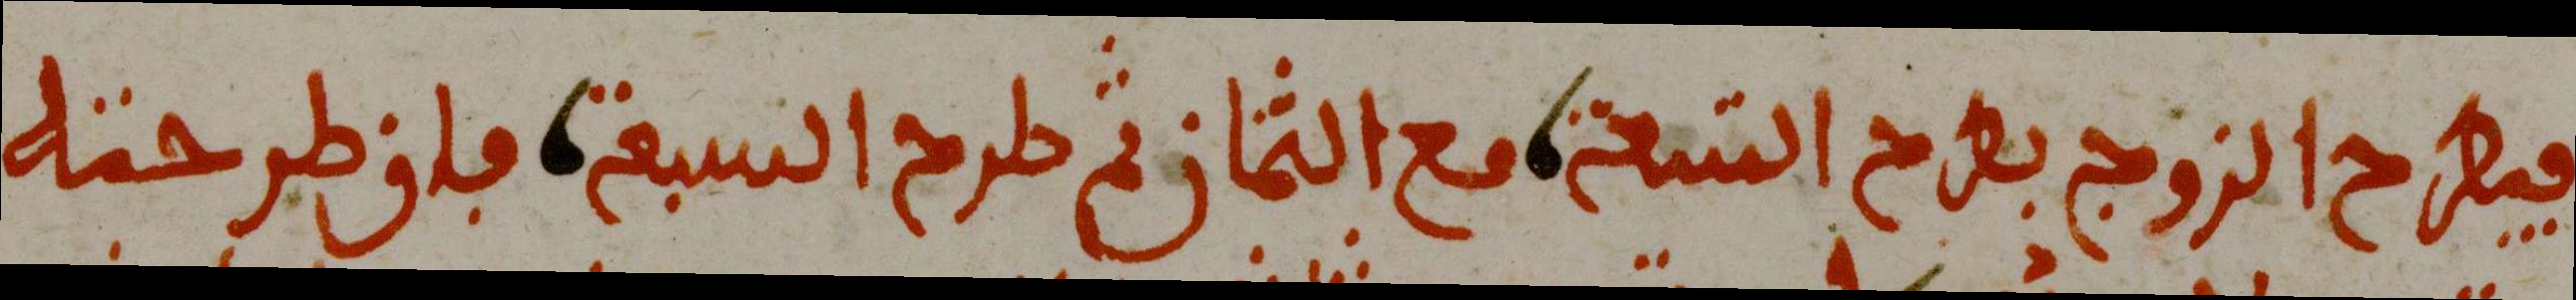فيطرح الزوج بطرح التسعة مع الثمان ثم السبعة فان طرحته
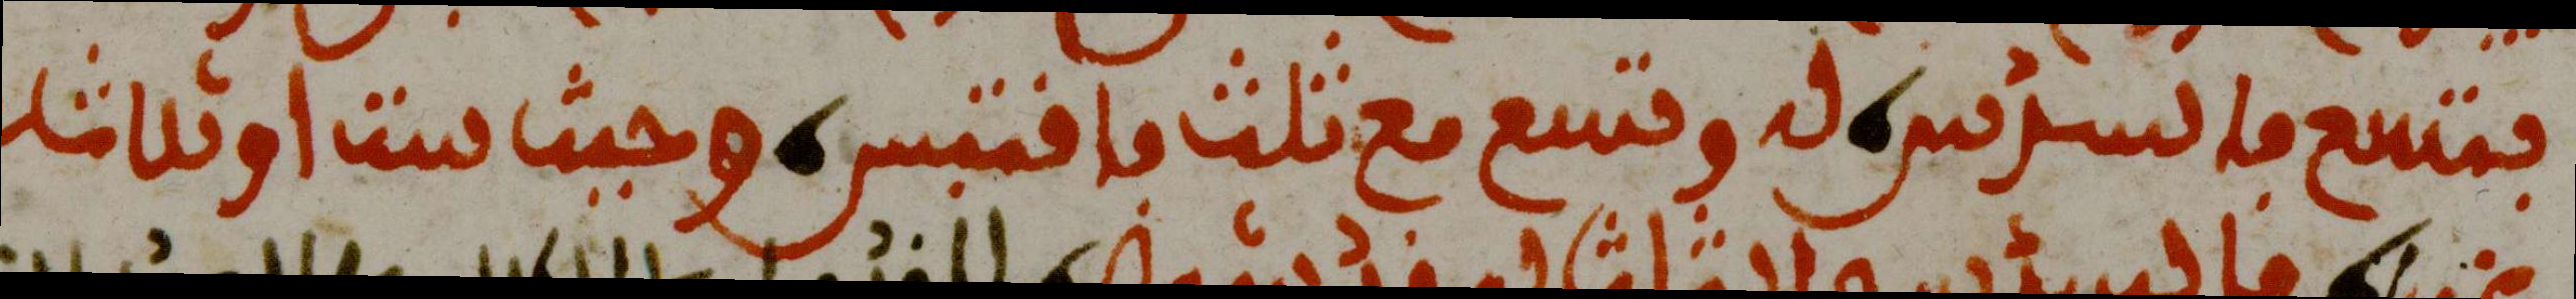فتسع فالسدس له وتسع مع ثلث فاقتبس وحيث ست او ثلاث
